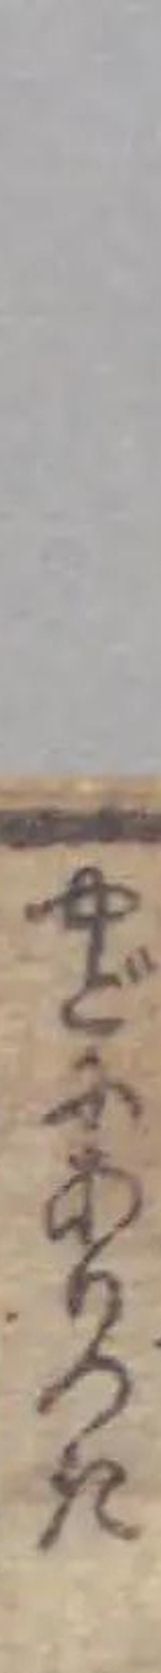やどにありつき
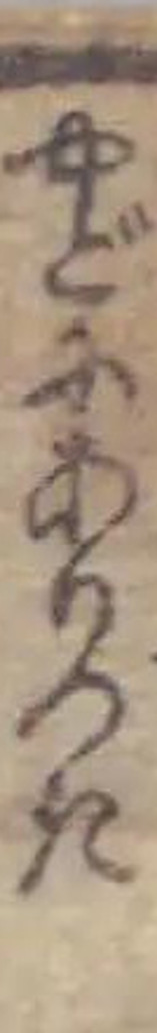やどにありつき
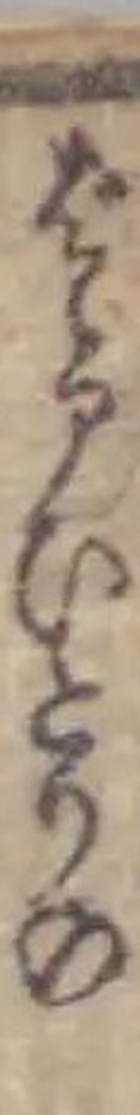ばゞアひとりの
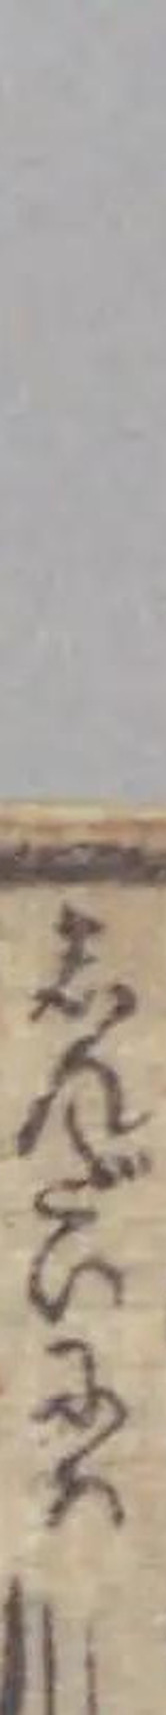しんだいには
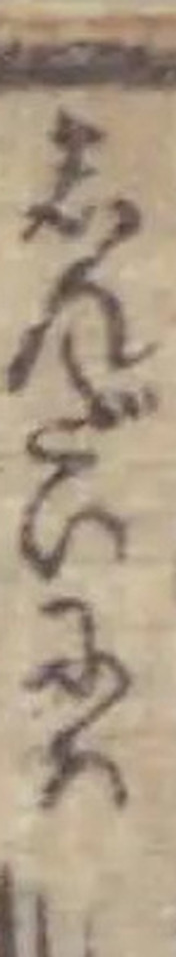しんだいには
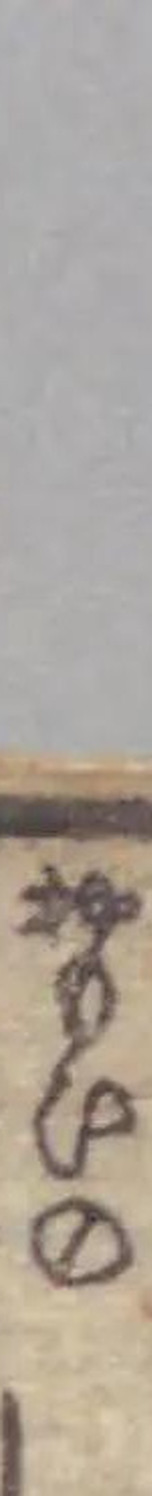おもひの
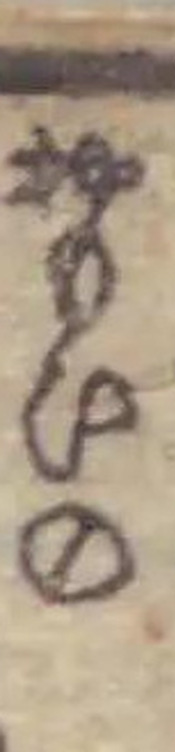おもひの
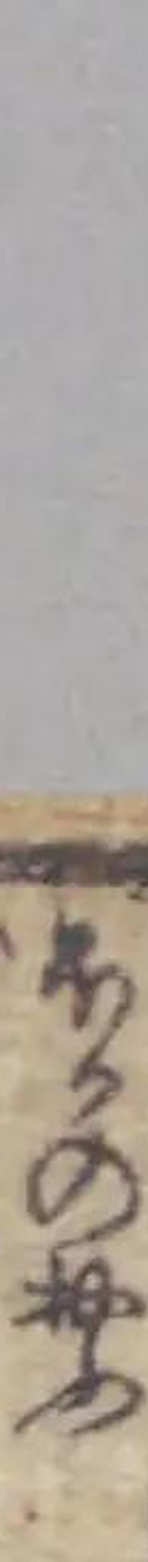ほかのおふ
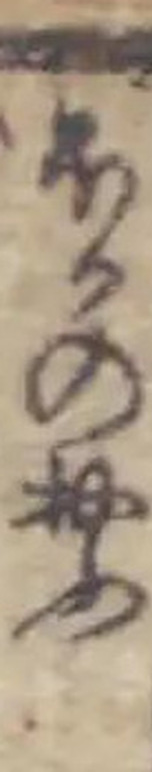ほかのおふ
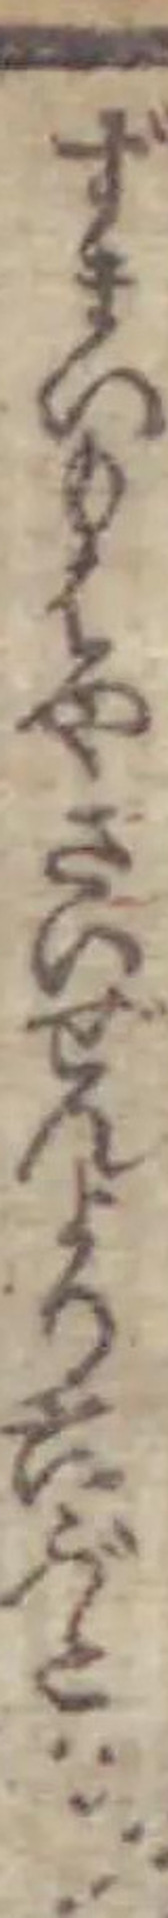ずまいもはやさいぜんより六ぶと
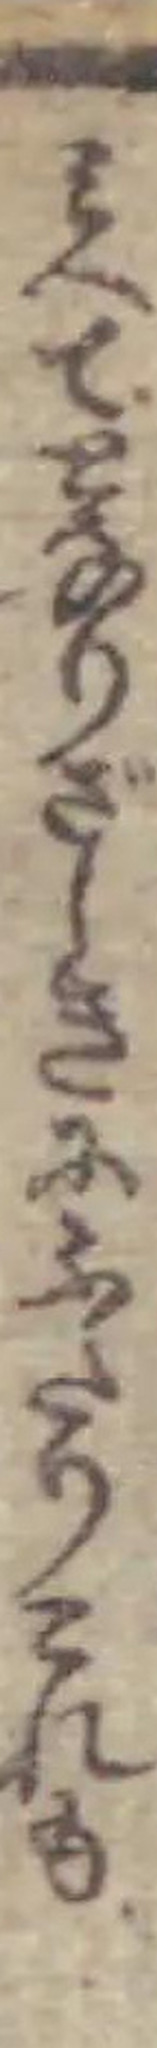みへてとなりざしきにふたりこれも
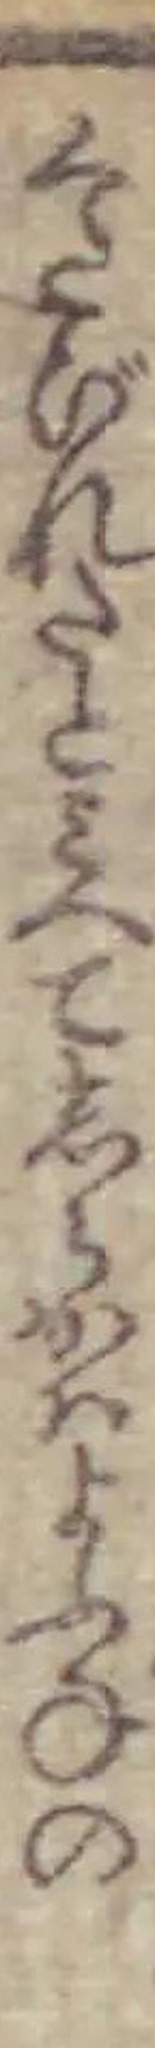くたびれたとみへてしらかはよふねの
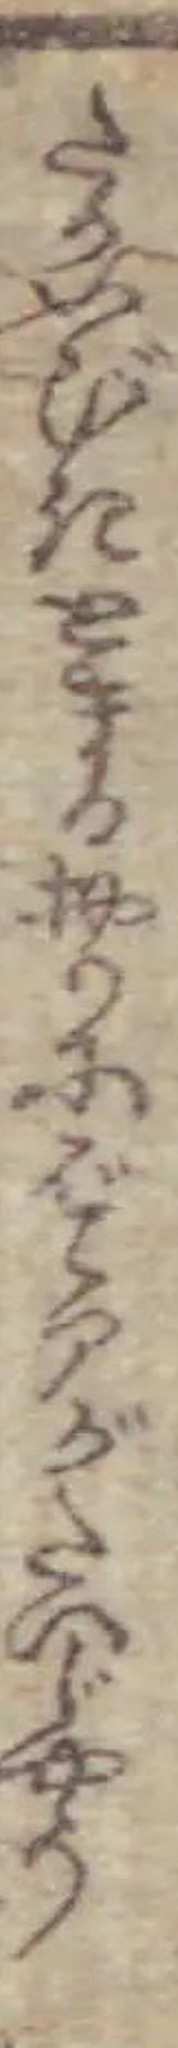たかいびきとまるおりにばゞアがたいじやう
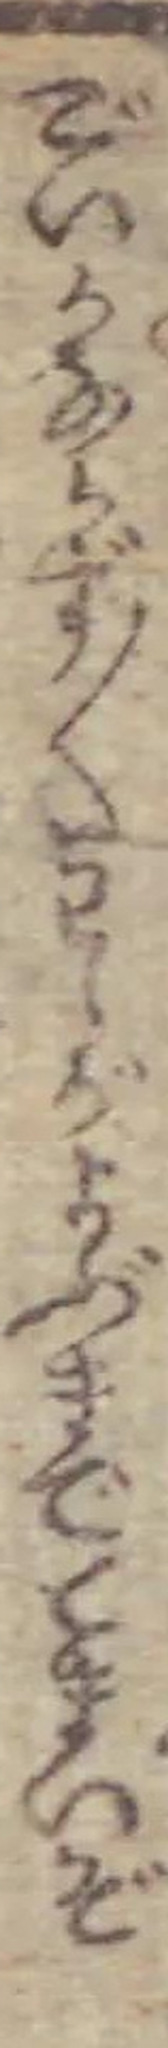ごいかならず〳〵わしがよぶまでこまいぞ
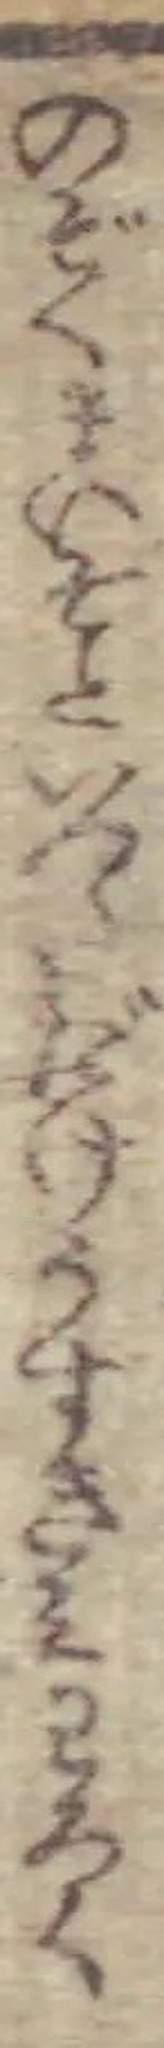のぞくまいそといつただけうすきみわろく
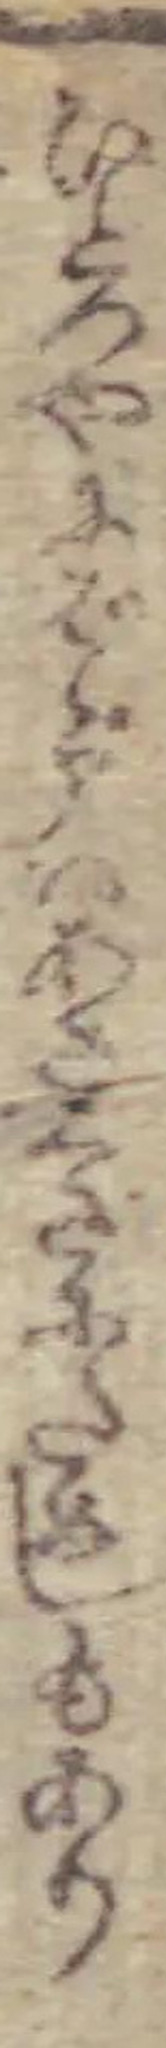ひとつやにばゞアはあさくさにためしもあり
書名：もふもふもふ怖噺 2巻
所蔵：国立国会図書館 National Diet Library, JAPAN
